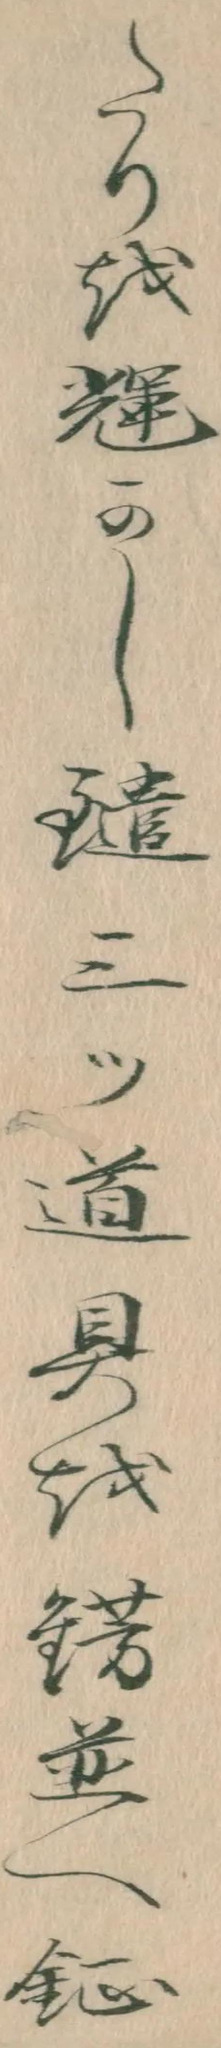たりを輝かし鑓三ツ道具を餝並へ鉦
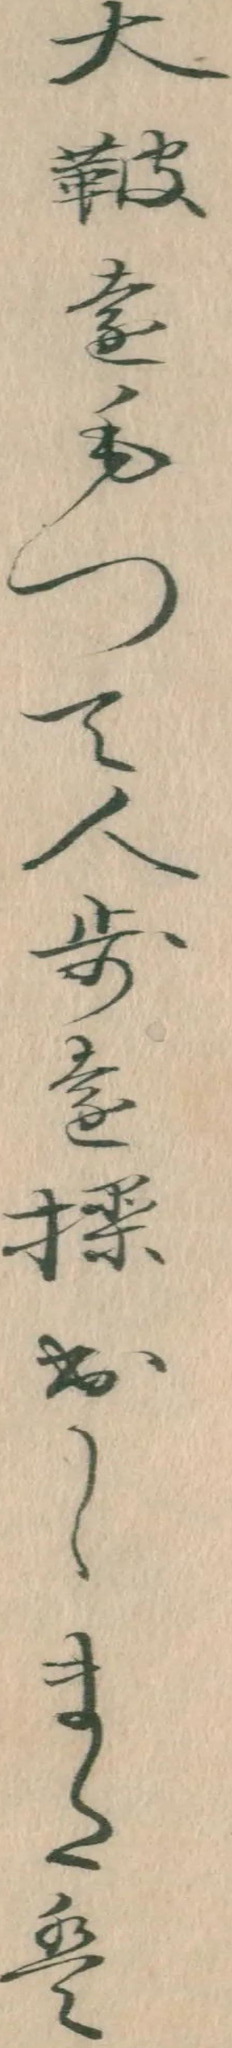大皷をもつて人歩を操出しまたは
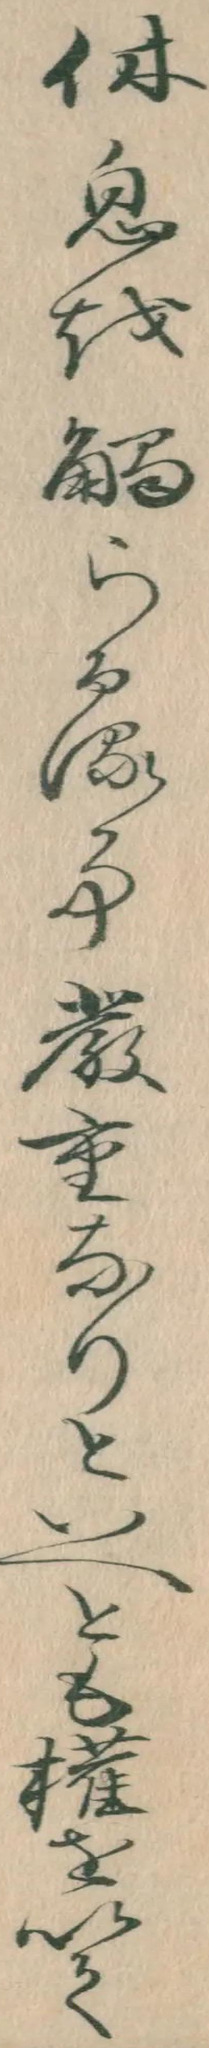休息を触らるる事厳重なりといへとも権を以て
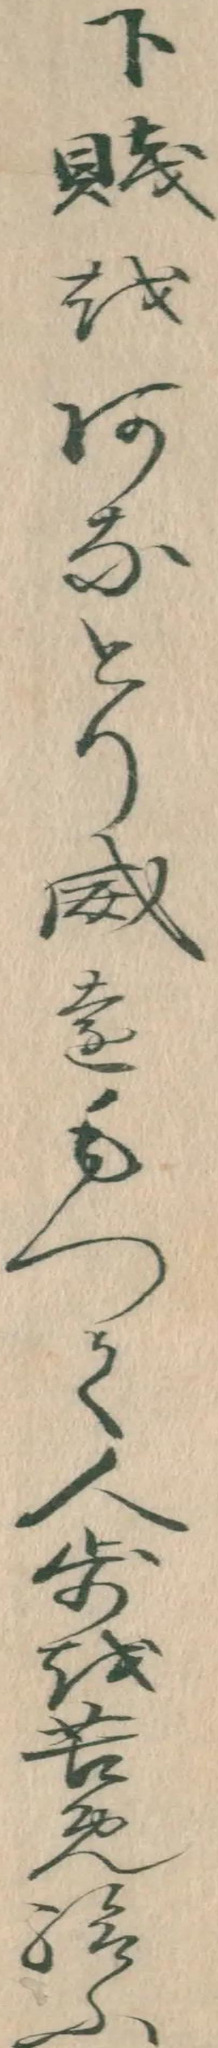下賎をあなとり威をもつて人歩を苦め給ふ
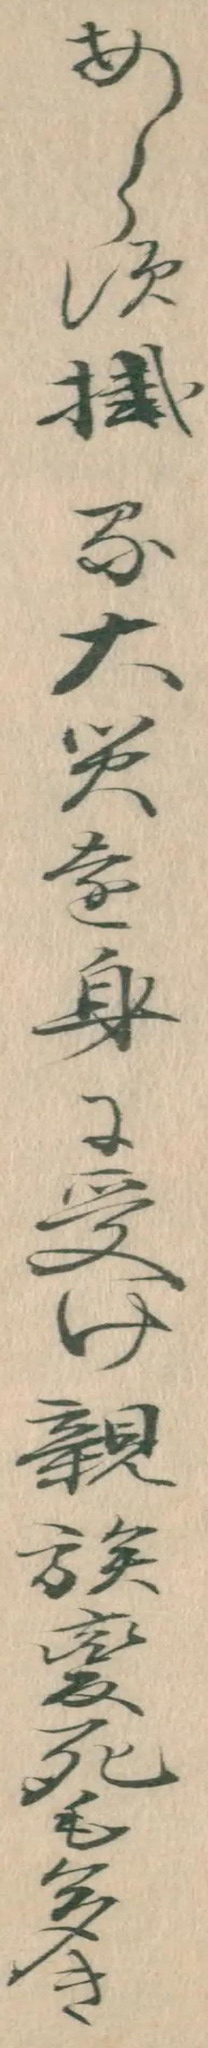あらす掛る大災を身に受け親族変死も多き
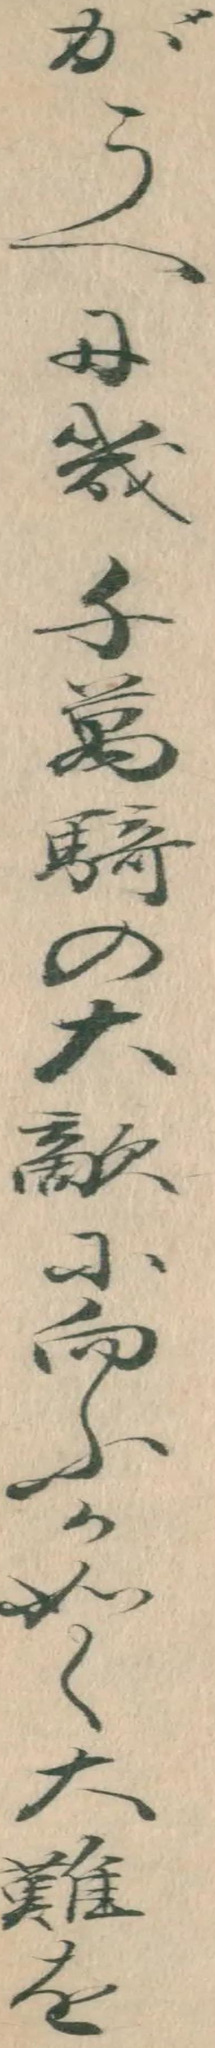がうへに幾千万騎の大敵に向ふか如く大難を
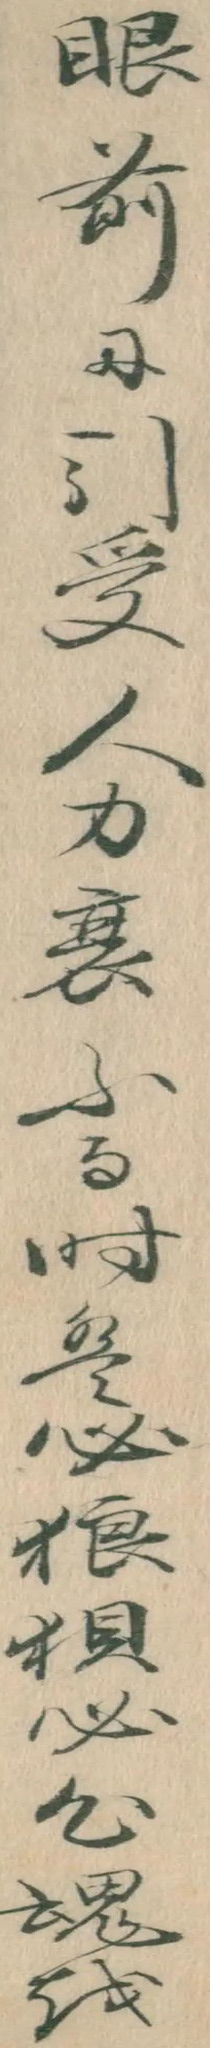眼前に引受人力衰ふる時は必狼狽必心魂を

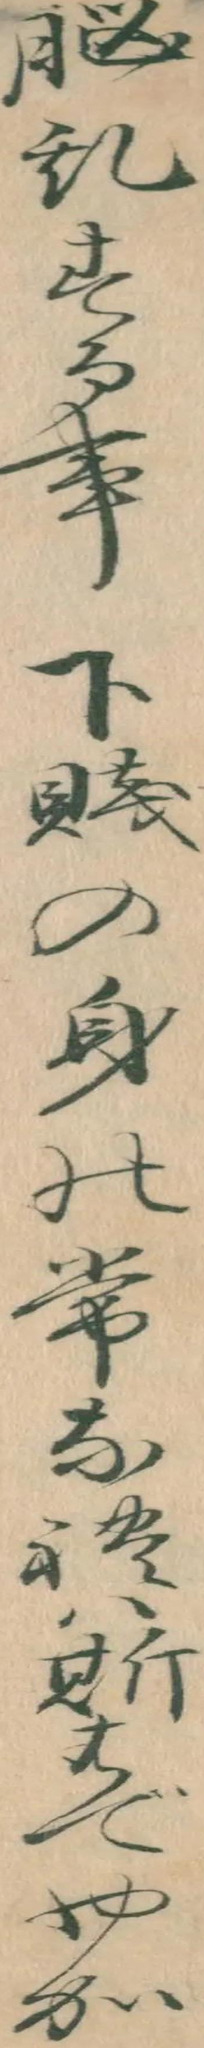脳乱する事下賎の身の常なれは斯はでやか
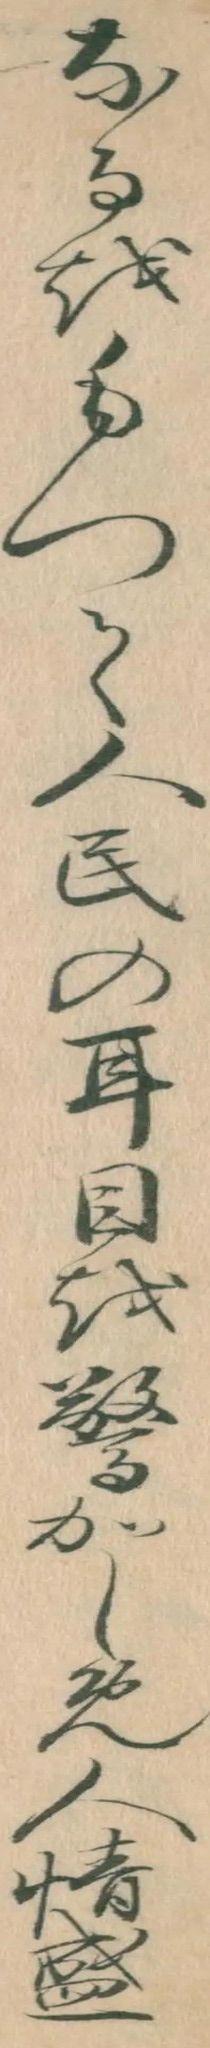なるをもつて人民の耳目を驚かしめ人情盛
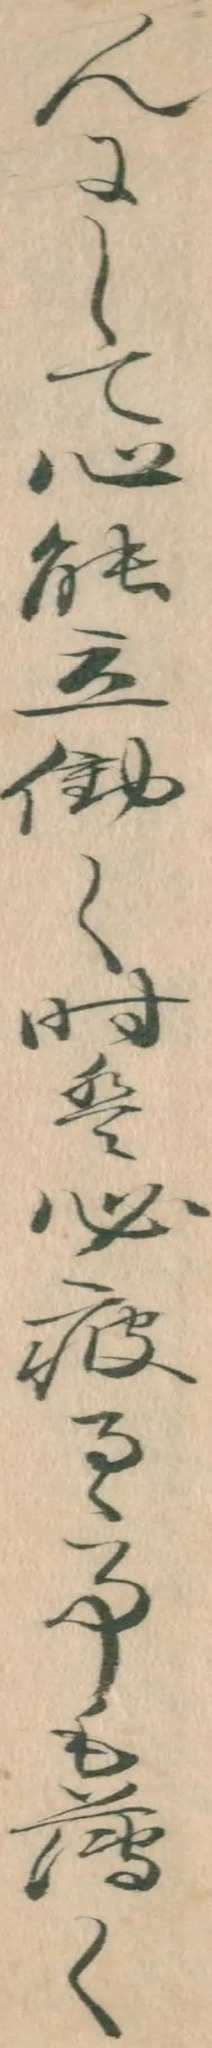んにして心能立働く時は必疲るゝ事も薄く
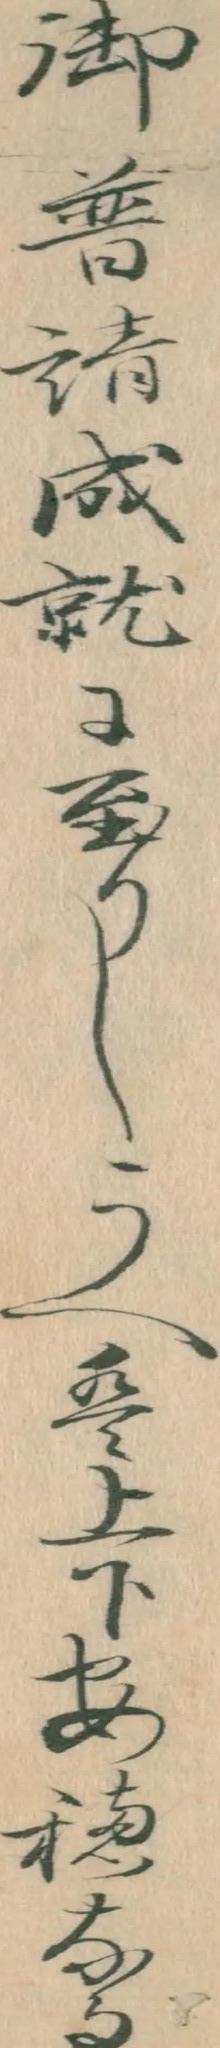御普請成就に至りしうへは上下安穂なる
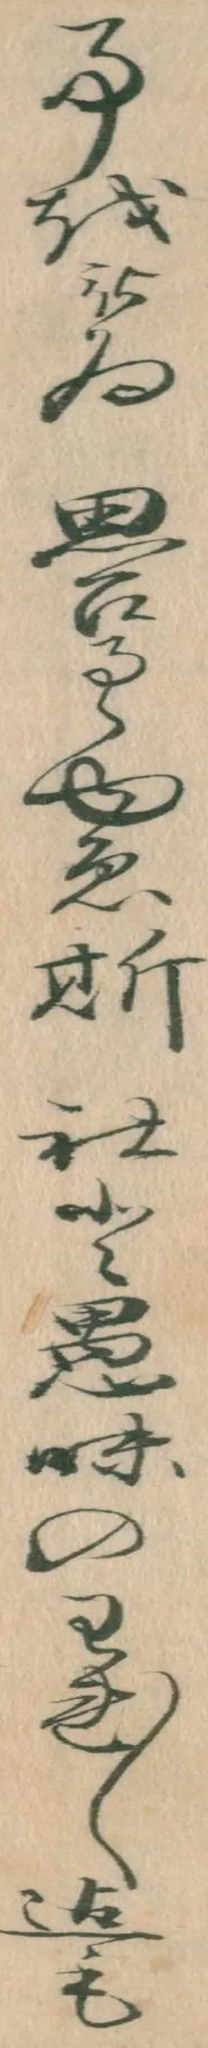事を被為思召るゝゆゑ斯社と愚昧のわれ〳〵迄も
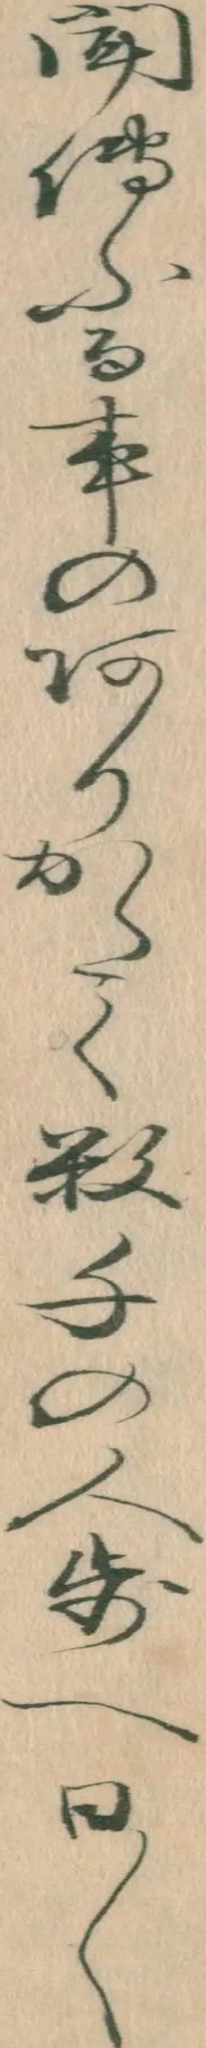聞伝ふる事のありかたく数千の人歩へ日〳〵
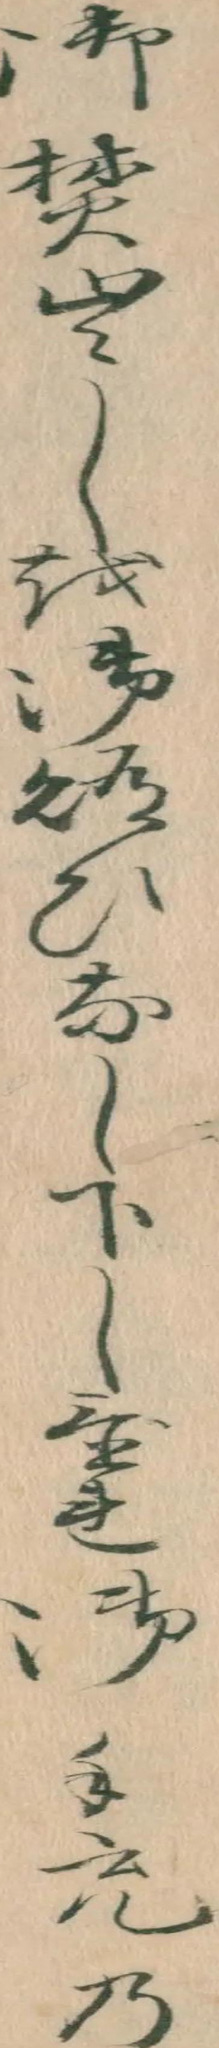御焚出しを御賄ひなし下し置れ御手充の
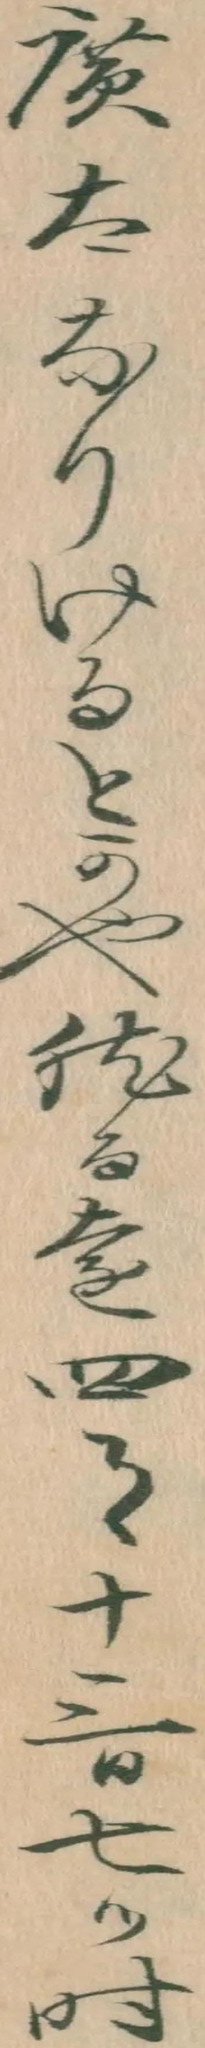広太なりけるとかや然るを四月十三日七ツ時
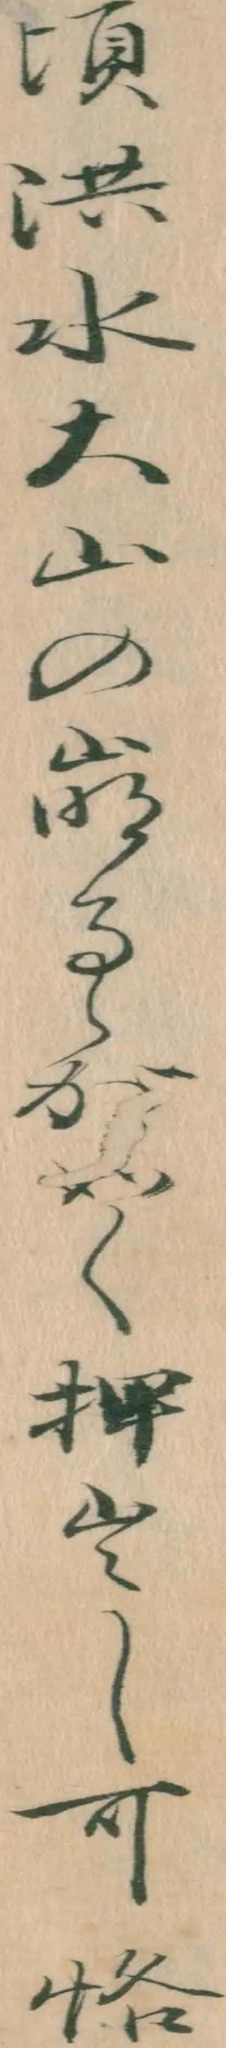頃洪水大山の崩るゝか如く押出可恪？
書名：俗語之種. [6]
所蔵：国立国会図書館 National Diet Library, JAPAN
